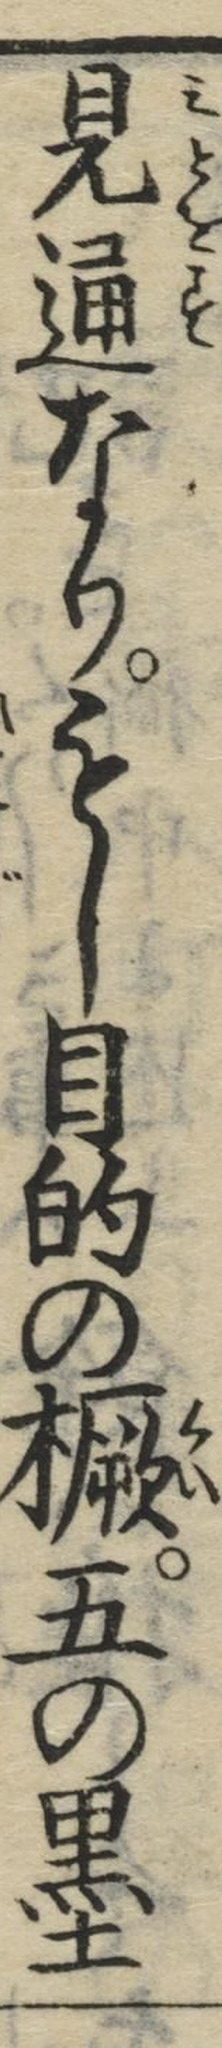見通なり。もし目的の橛。五の墨
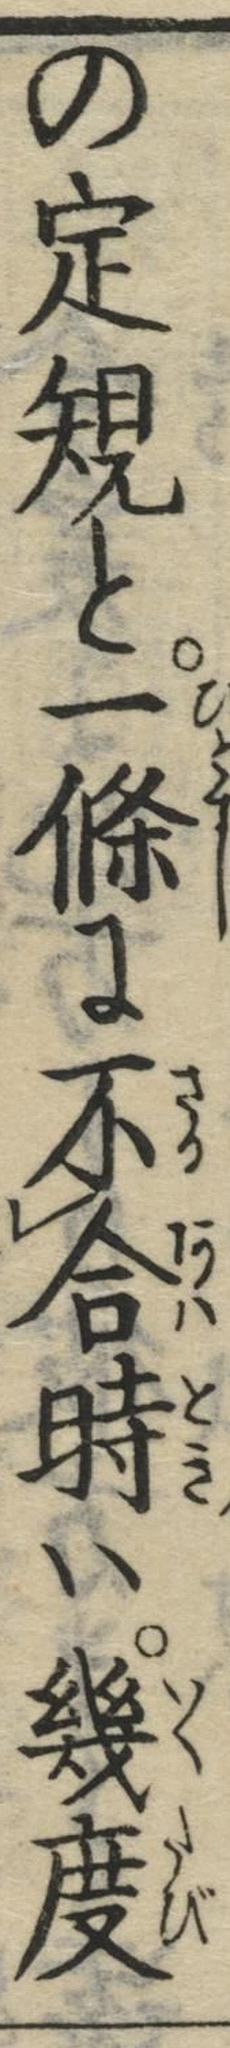の定規と。一條に不合時は。幾度
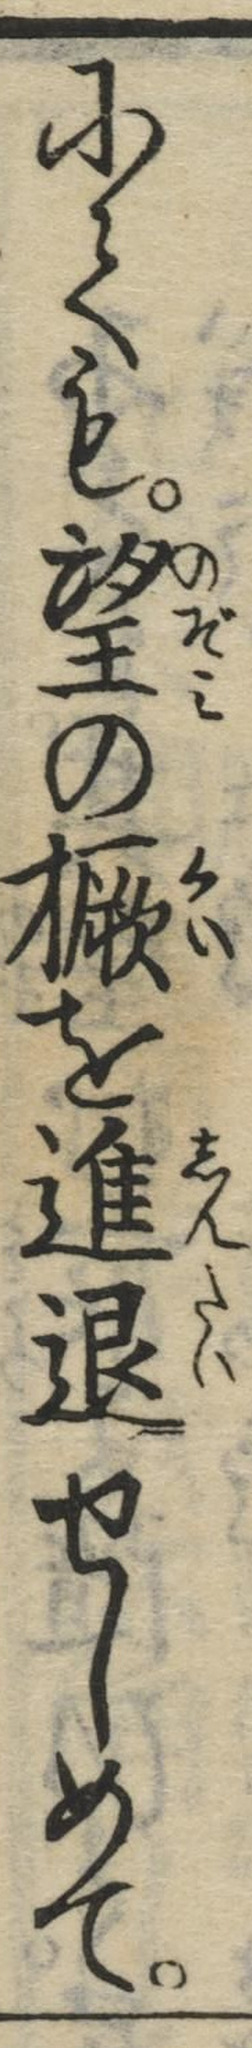にても。望の橛を進退せしめて。
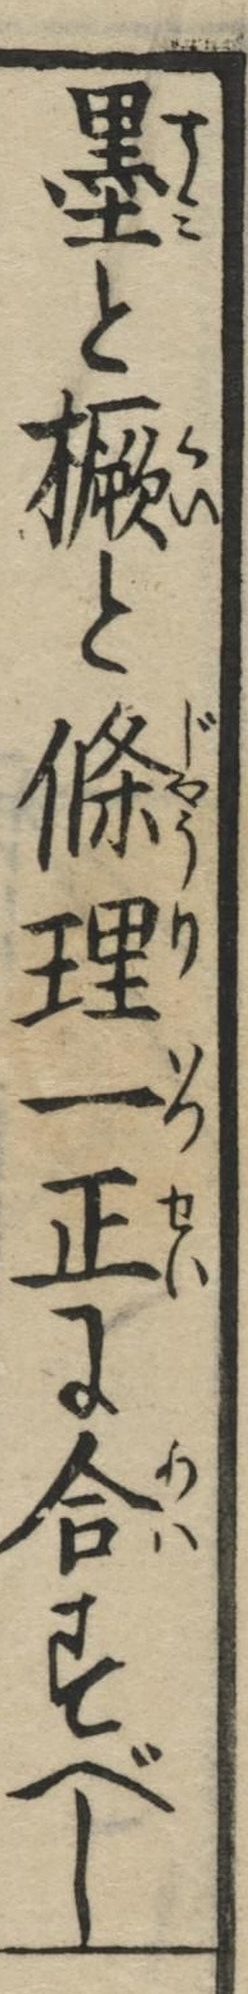墨と橛と條理一正に合すべし
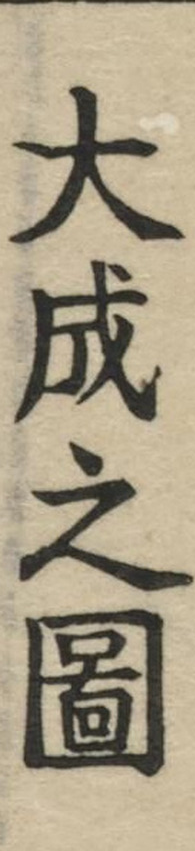大成之図
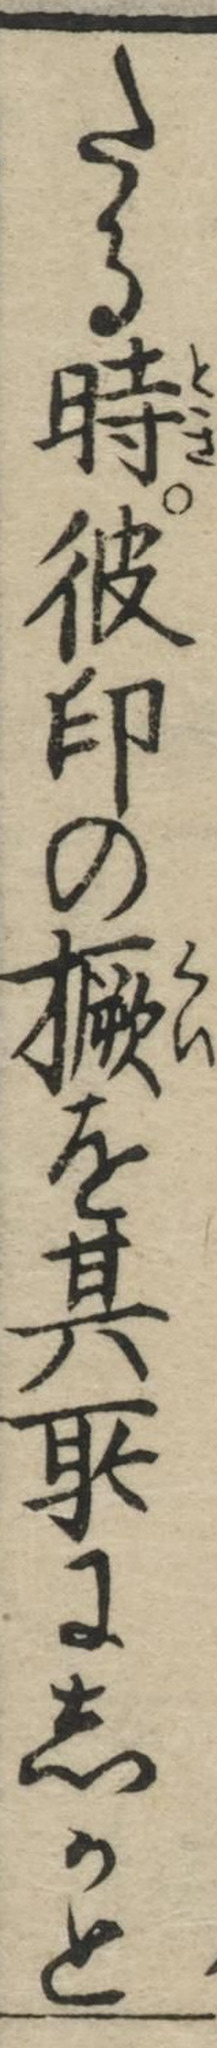たる時。彼印の橛を其所しかと
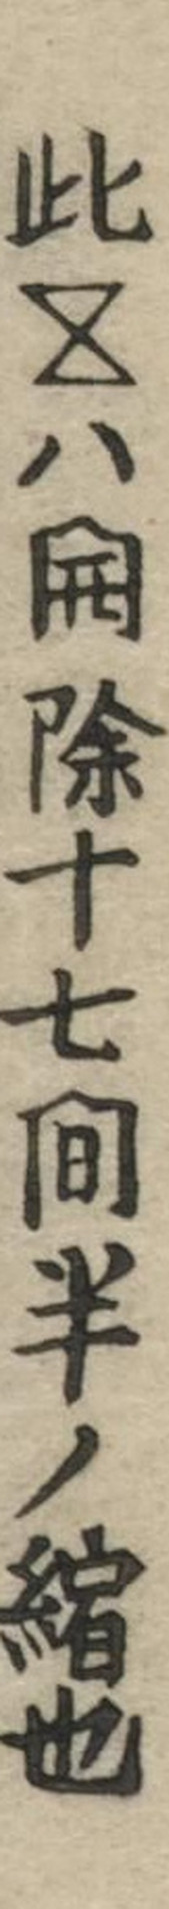此▽△ハ開除十七間半ノ縮也
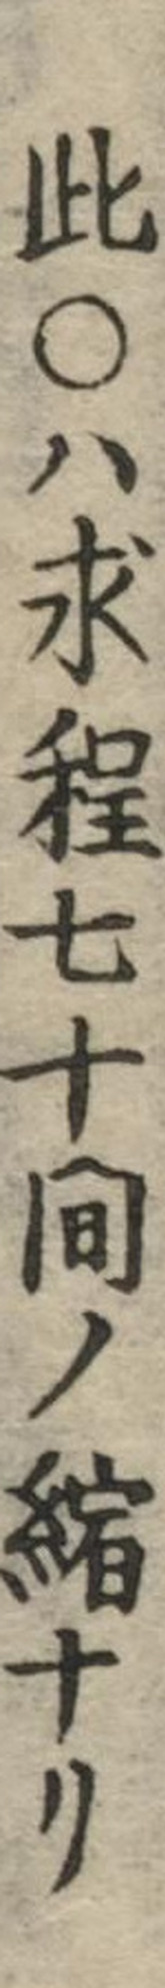此○ハ求程七十間ノ縮ナリ
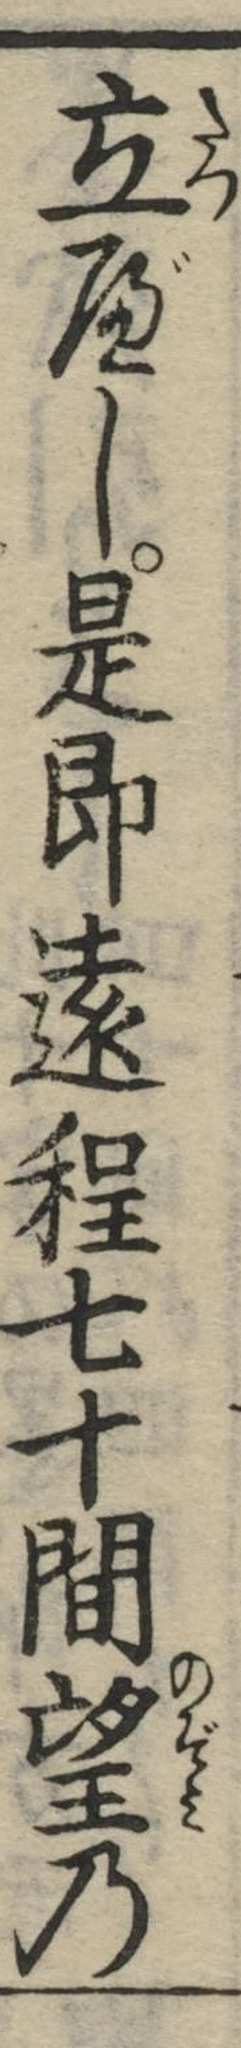立べし。是即遠程七十間望の
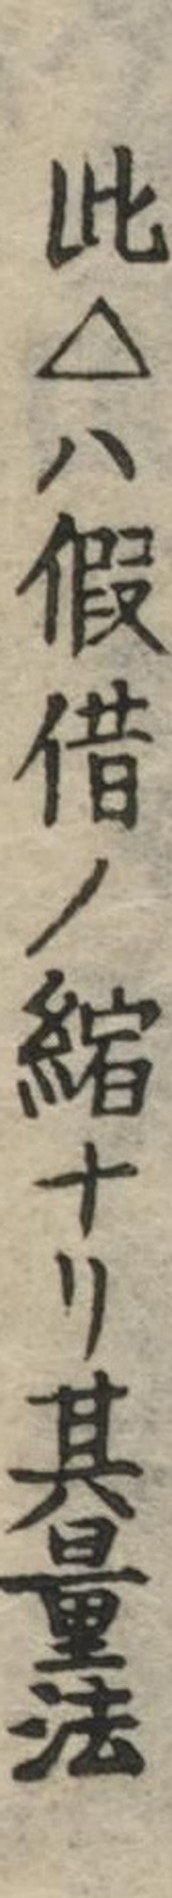此△ハ仮借ノ縮ナリ其量法
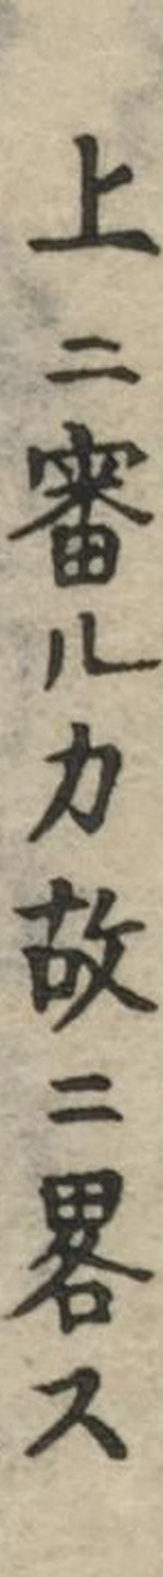上ニ審ルカ故ニ略ス
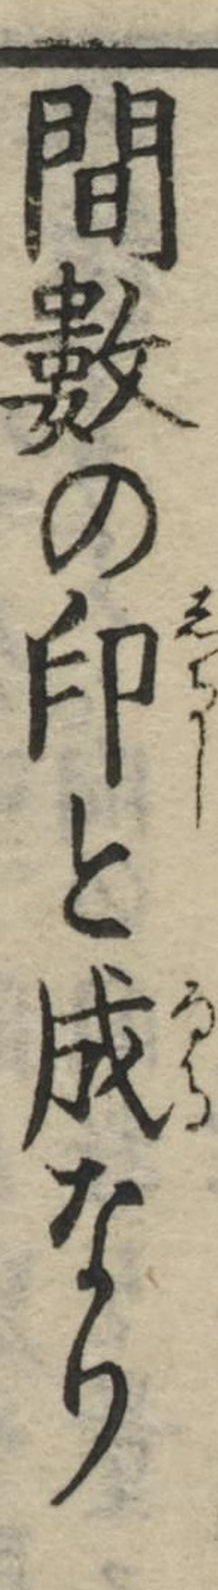間数の印と成なり
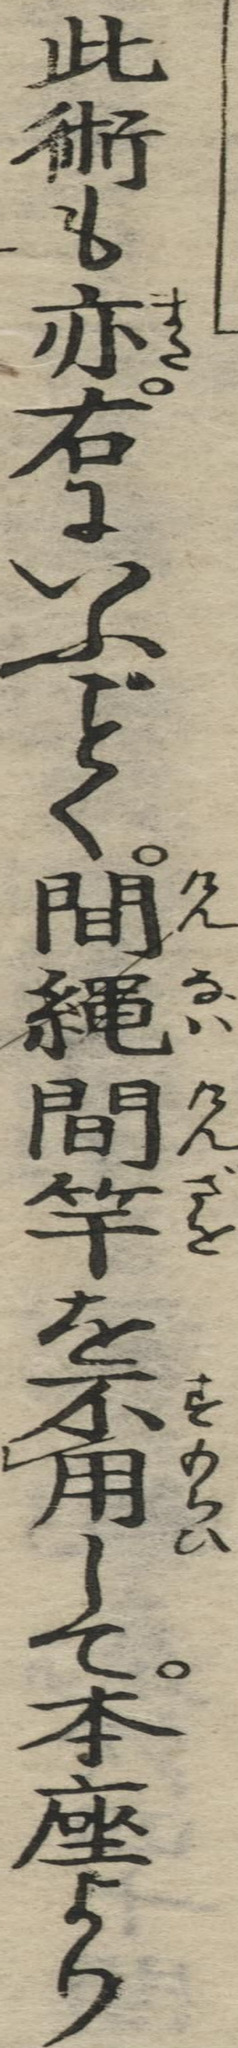此術も亦。右にいふごとく。間縄間竿を不用して。本座より
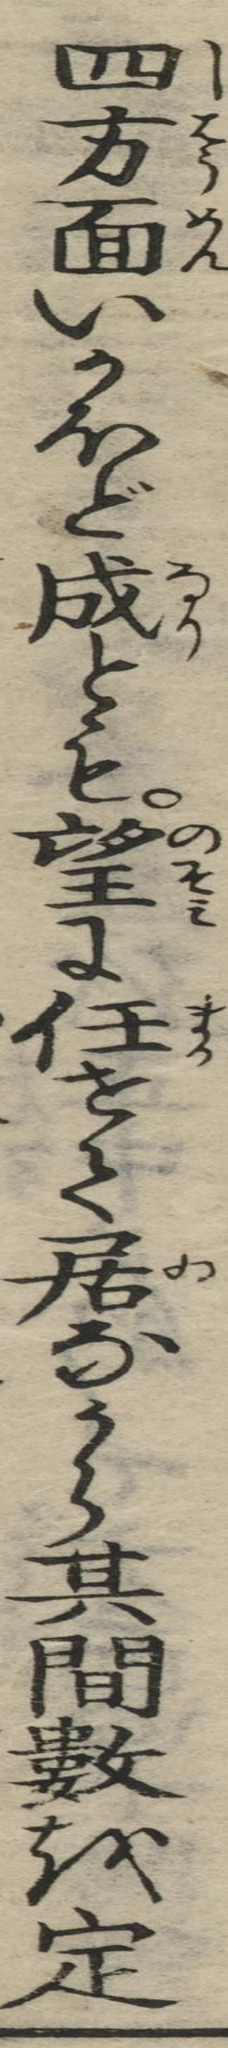四方面いかほど成とも。望に任せて居なから其間数を定
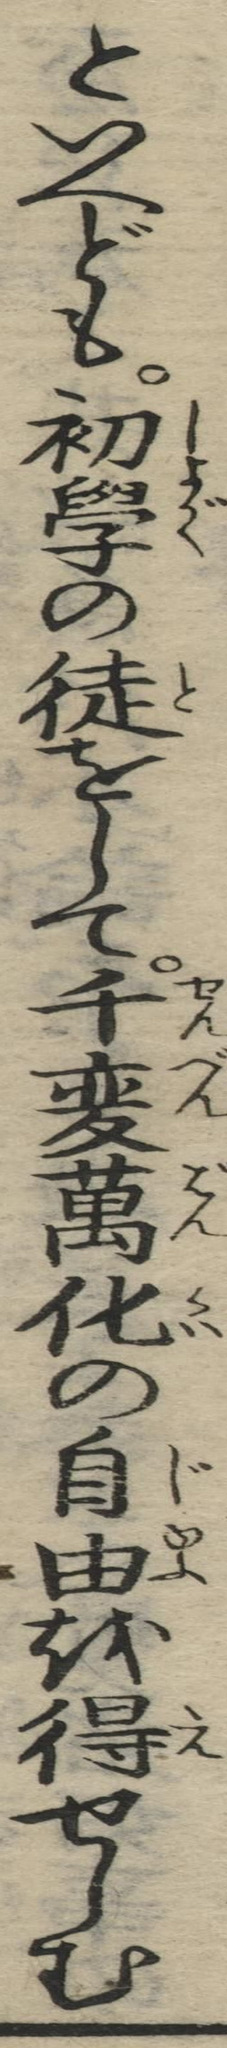といへども。初学の徒をして。千変萬化の自由を得せしむ

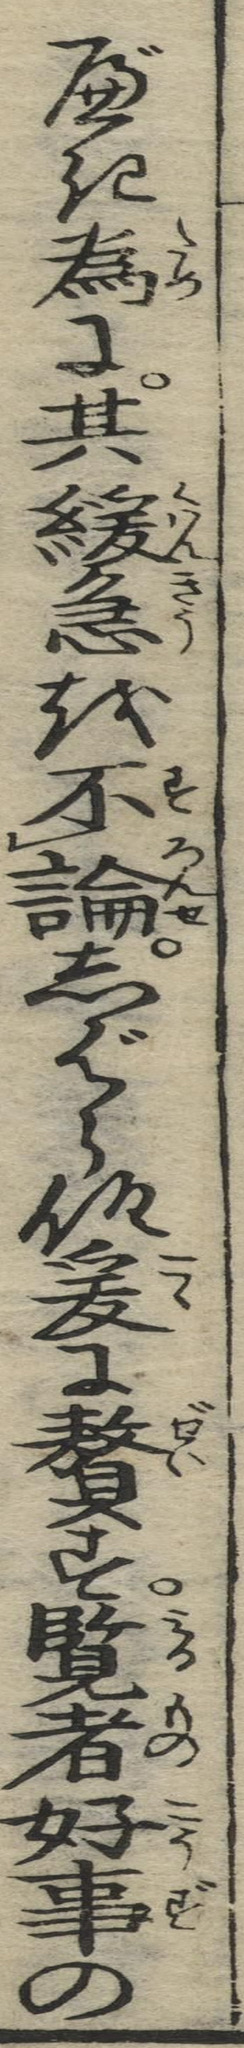べき為に。其緩急を不論。しばらく爰に贅す。覧者好事の
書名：量地指南　巻之二（内題）
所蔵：東京大学地震研究所図書室 Earthquake Research Institute Library, The University of Tokyo, JAPAN
